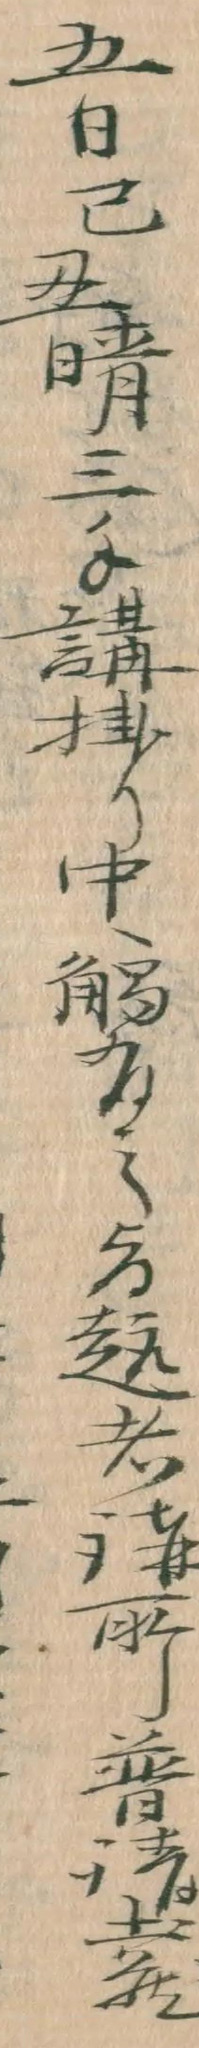五日己丑晴三手講掛リ中へ触有之旨趣者講所普請土蔵
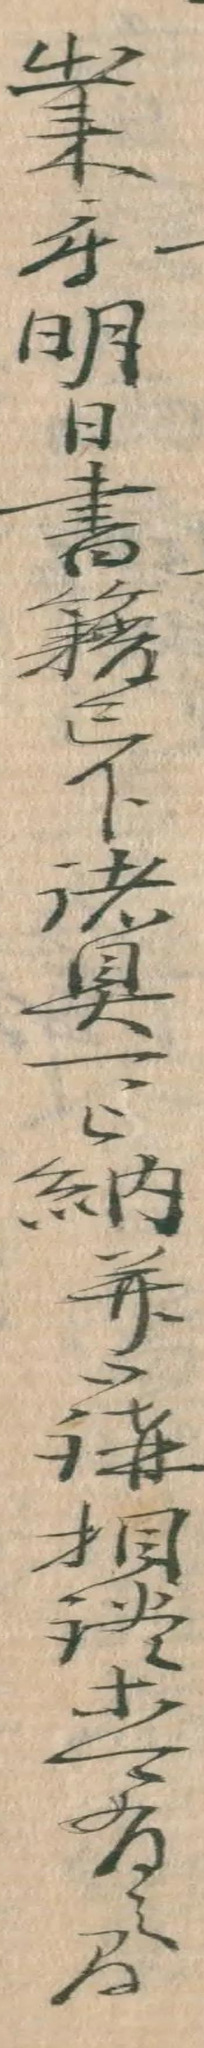出来ニ付明日書籍已下諸具可被納并御講相談等可有之間
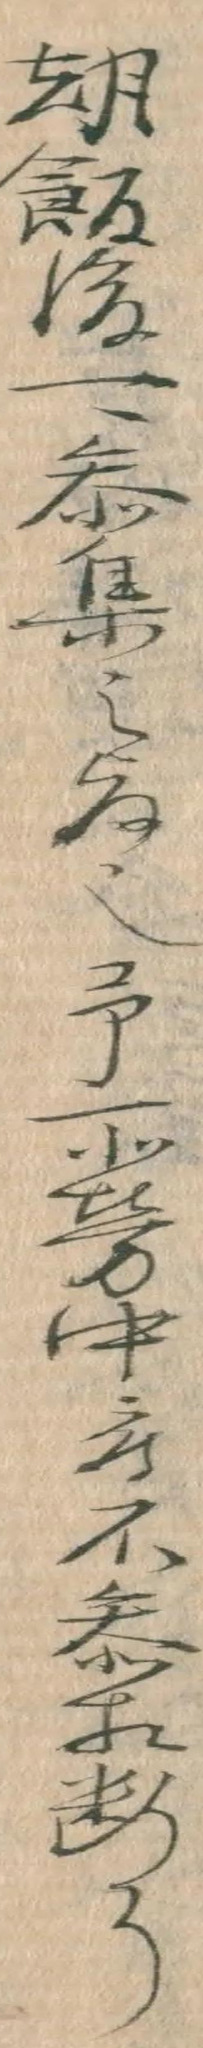朝飯後可参集之旨也予所労中ニ付不参相断了
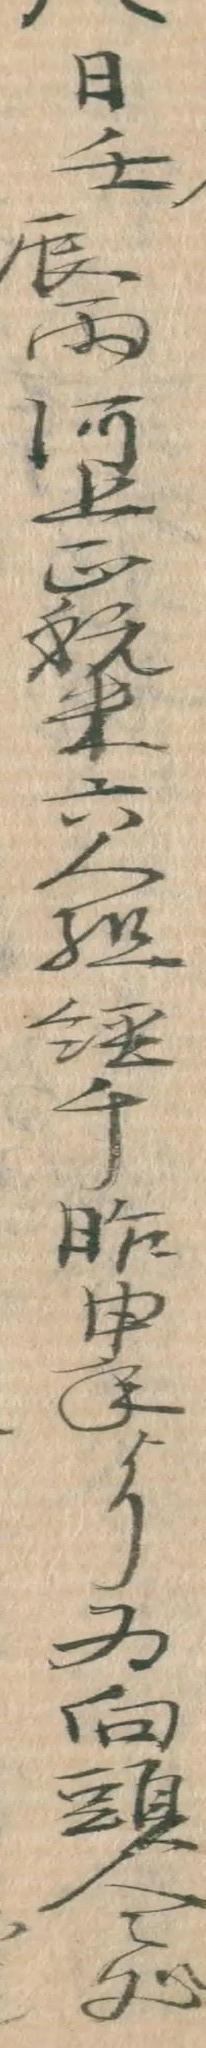八日壬良雨河上正税米六人組経千昨申承より為向頭人之処
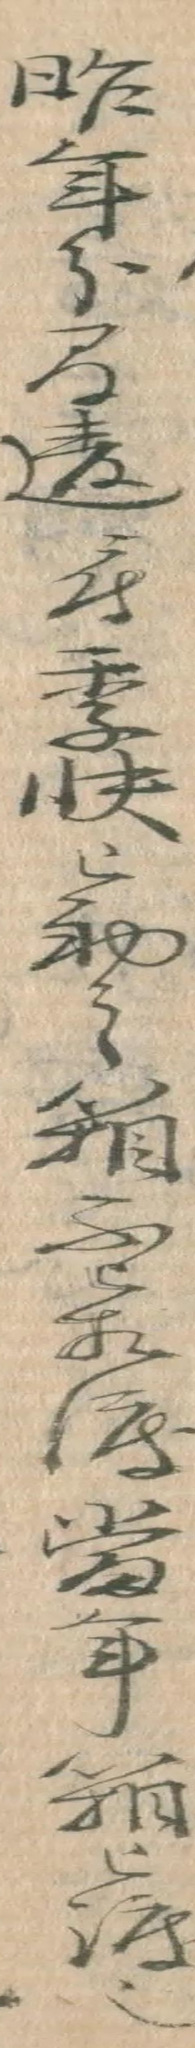昨年分間違ニ付季快之勤之箱不被相渡當年箱被渡之
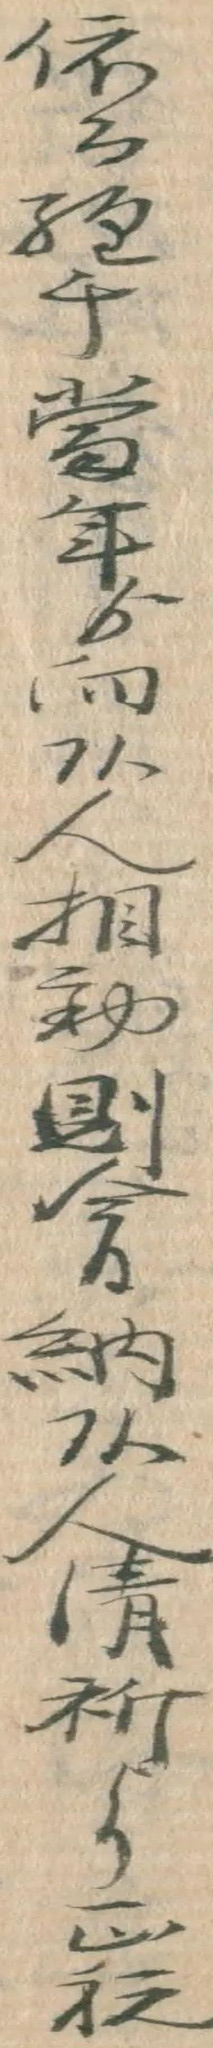依而経千當年ゟ向頭人相勤則今日納頭人清祈より正祝
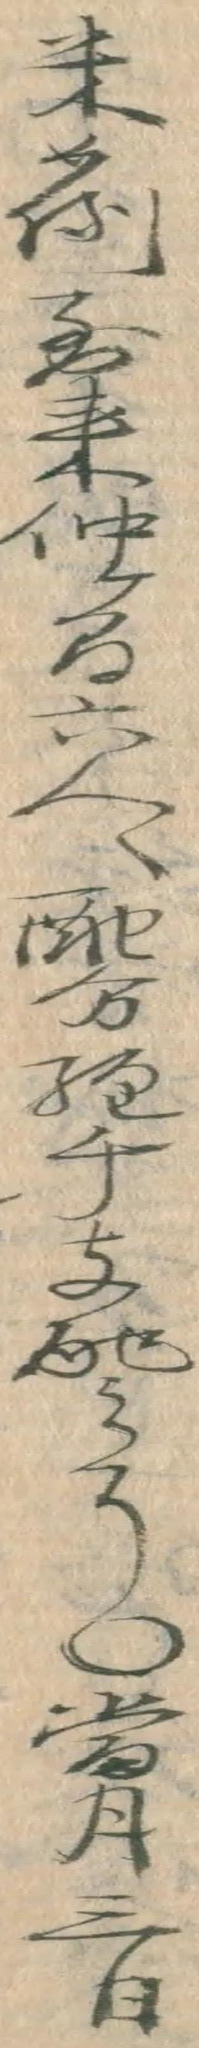米如例到来仲ヶ間六人へ配分軽千支配之了○當月三日
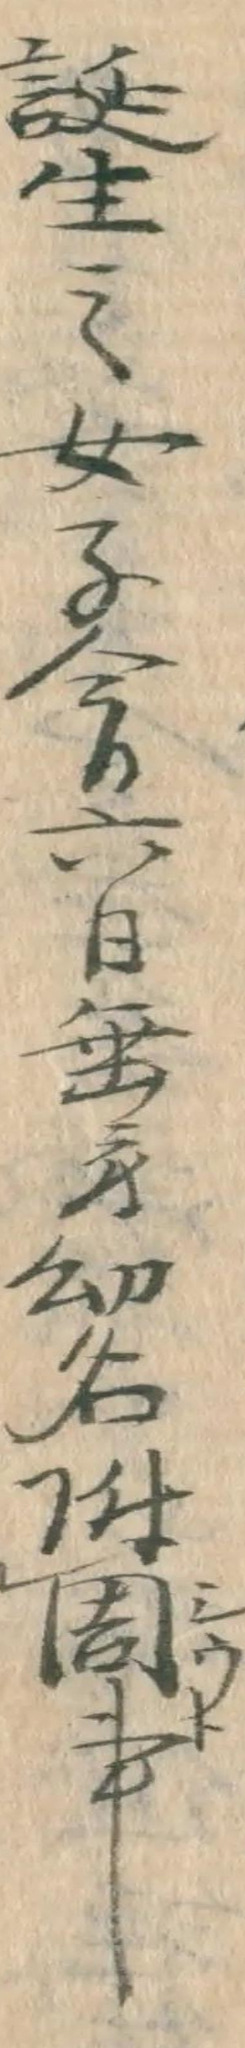誕生之女子今日六日歯ニ付幼名附周事
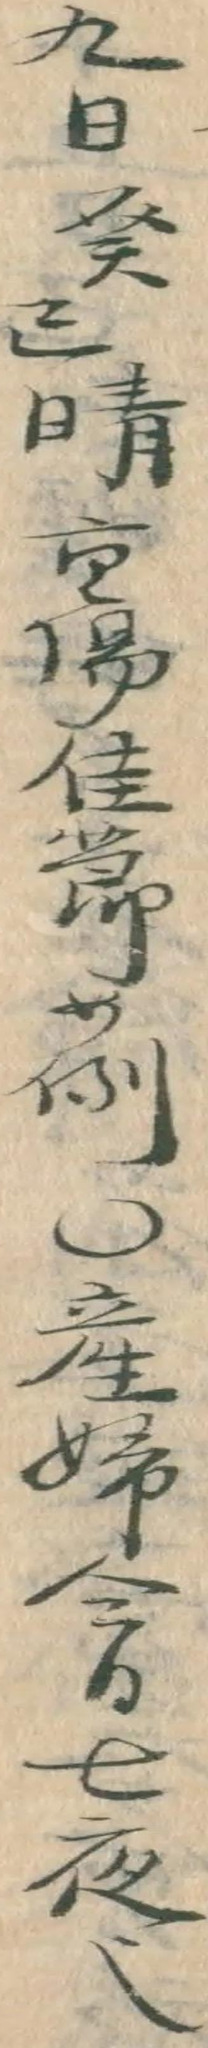九日癸巳晴重陽佳節如例〇産婦今日七夜也

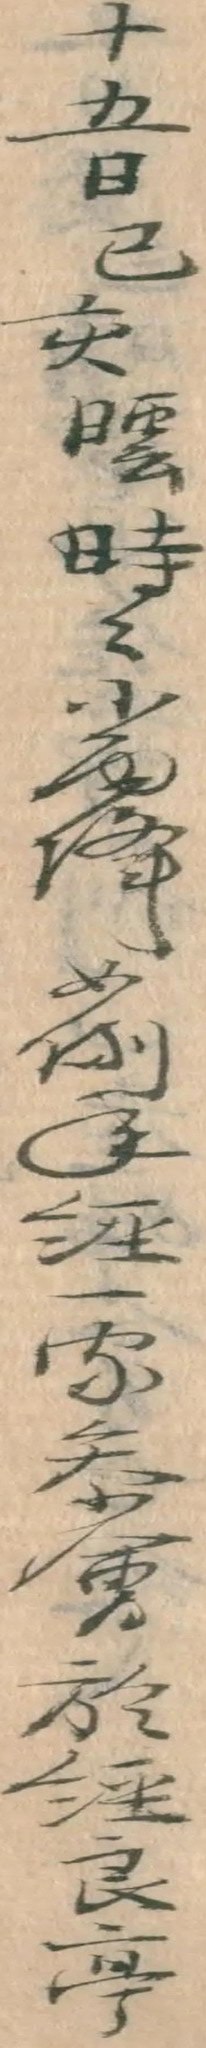十五日己亥曇時々小雨降如例年経一家参會於経良亭
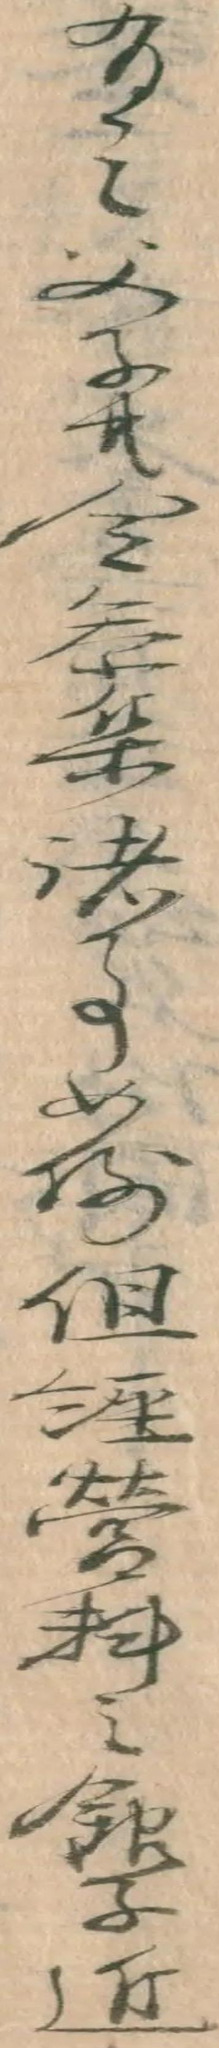有之父子共令参集諸事如例但経営料之銀子近
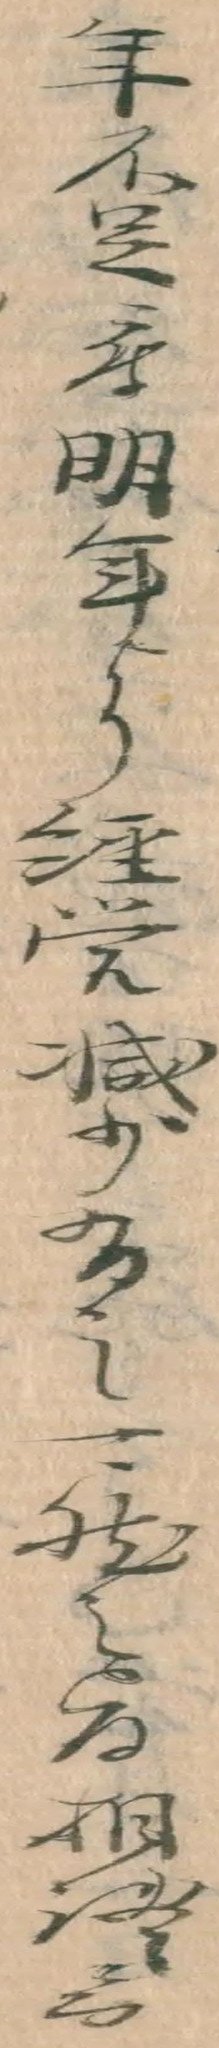年不足ニ付明年より経営減少有之可然之旨相認ニ而
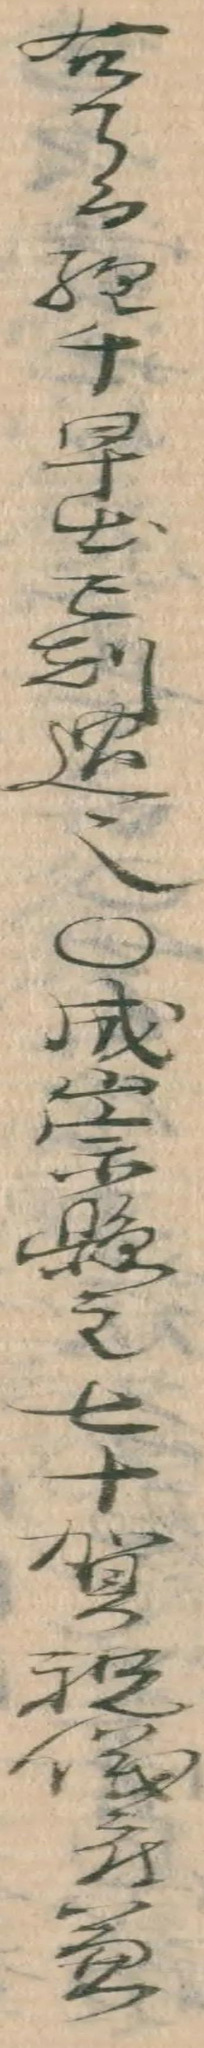右了而経十早出巳刻過也○成崇縣主七十賀祝儀ニ付兼
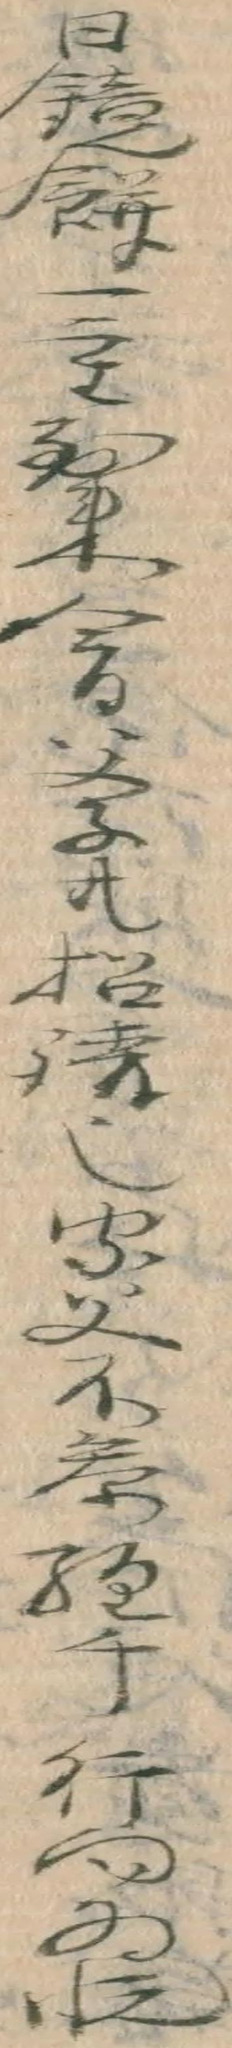日鏡餅一重到来今日父子共招請也家父不参経千行向為祝
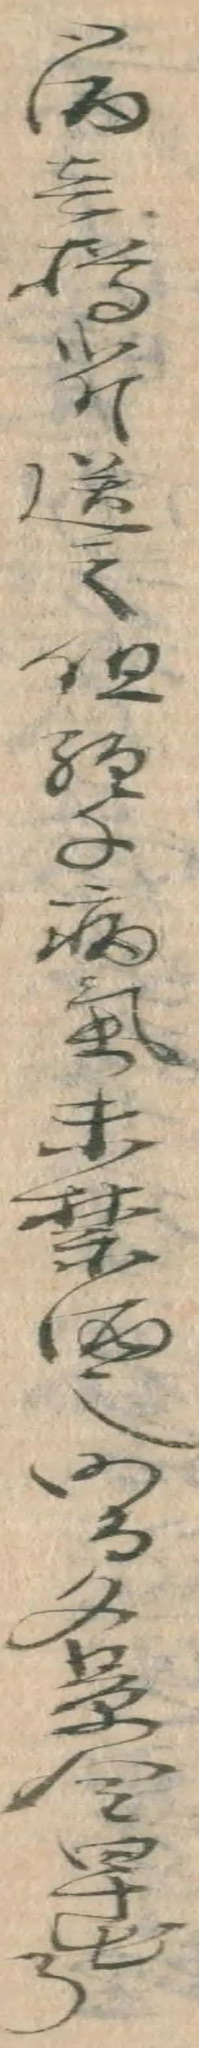御酒壱樽弐升送之但経子病気氣未禁酒也仍而夕景令早出了
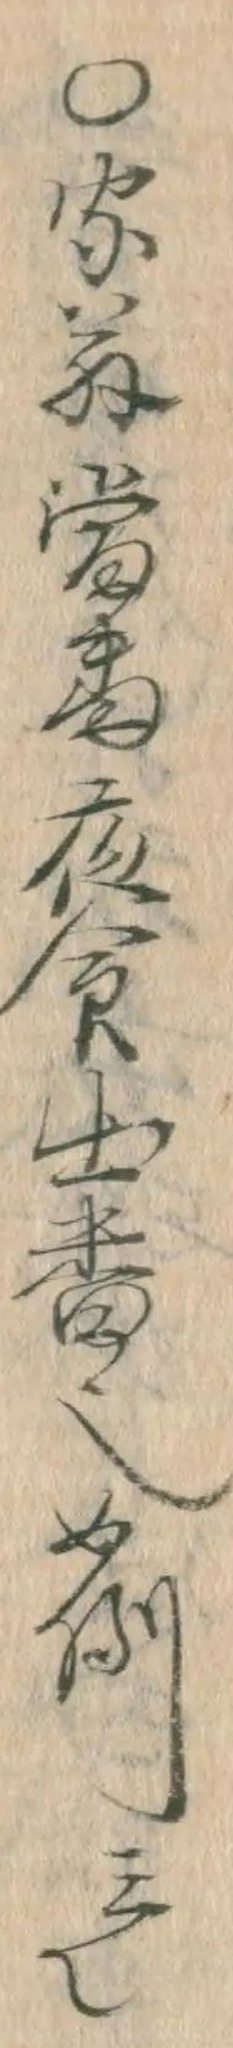○家翁當番夜食出番也如例云〻
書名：賀茂社記録. 第65冊
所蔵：国立国会図書館 National Diet Library, JAPAN
